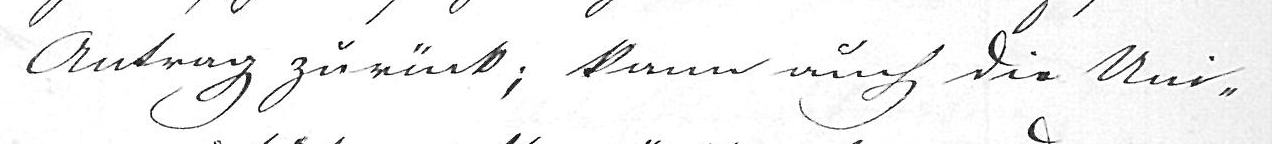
Antrag zurück; kann auch die Uni-
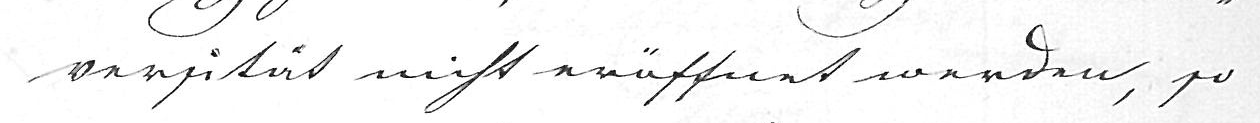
versität nicht eröffnet werden, so
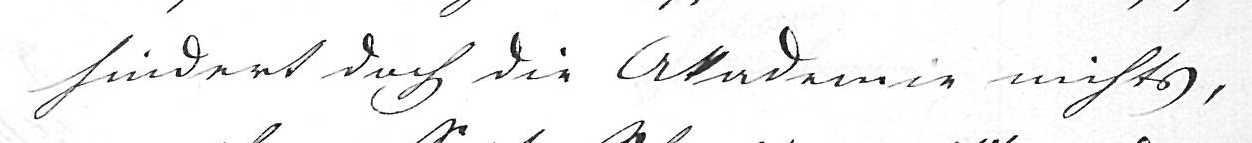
hindert doch die Akademie nichts,
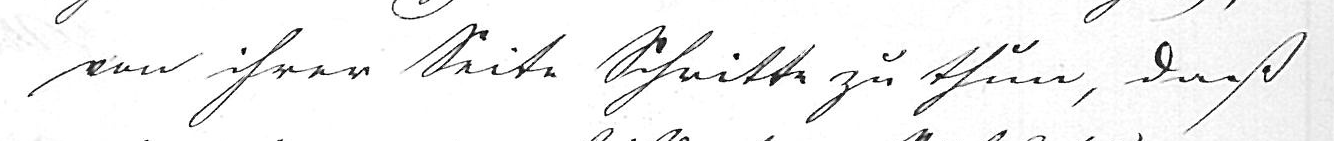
um ihrer Seite Schritte zu thun, daß
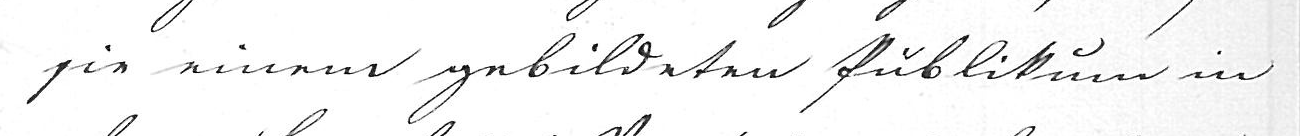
sie einem gebildeten Publikum in
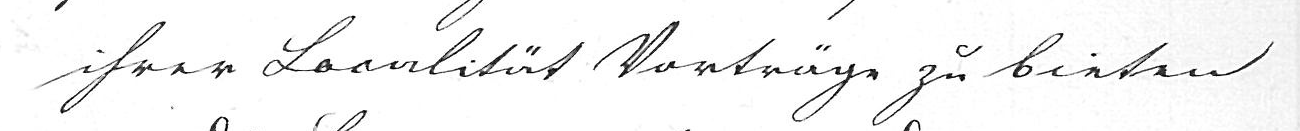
ihrer Localität Vorträge zu bieten
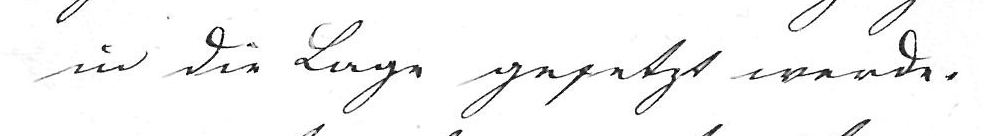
in die Lage gesetzt werde.
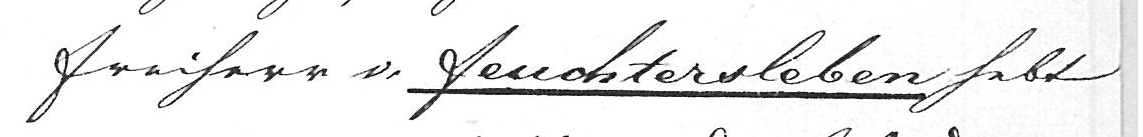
Freiherr v. Feuchtersleben hebt
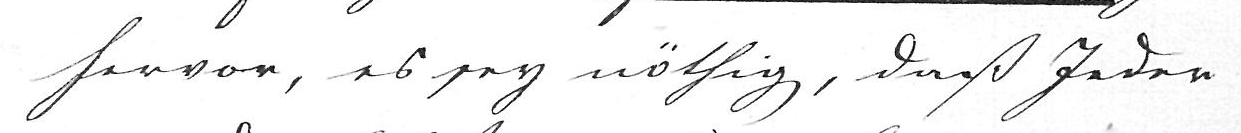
hervor, es sey nöthig, daß Jeder
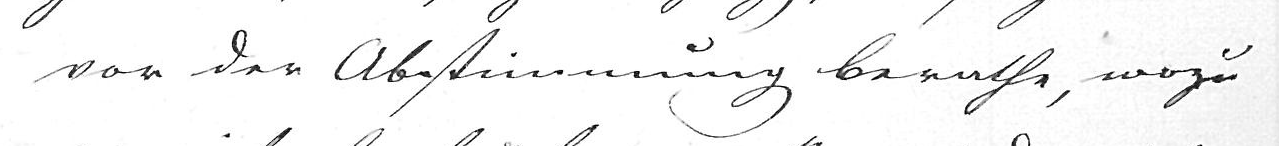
vor der Abstimung berathe, wozu
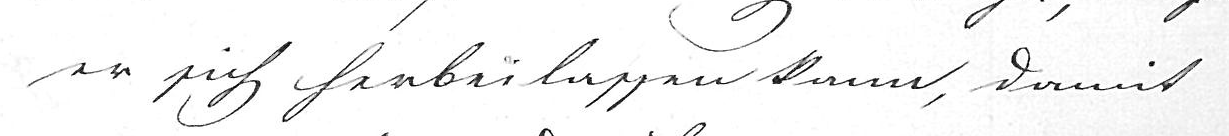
er sich herbeilassen kann, damit
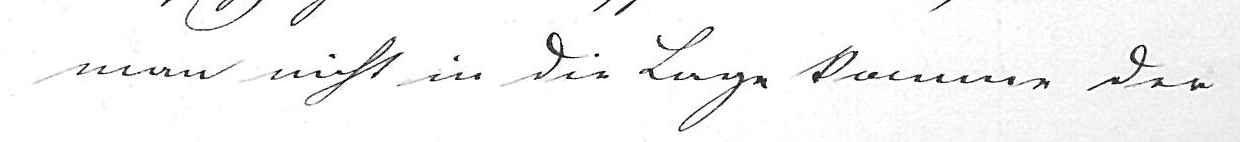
man nicht in die Lage komme der
